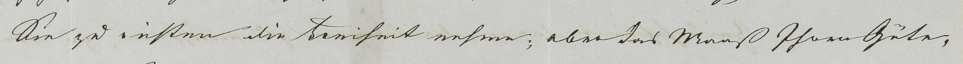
Sie zu richten die Freiheit nehme; aber das Maaß Ihrer Güte,
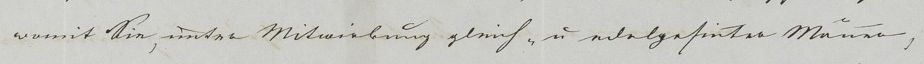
womit Sie, unter Mitwirkung gleich- u edelgesinnter Männer,
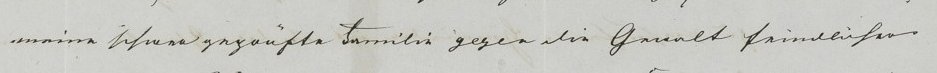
meine schwer geprüfte Familie gegen die Gewalt feindlicher
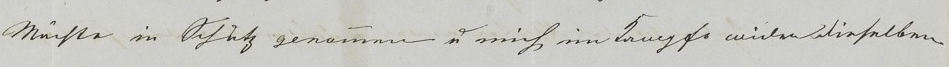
Mächte in Schutz genommen u mich im Kampfe wider dieselben
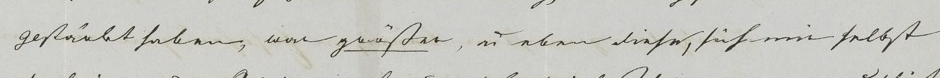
gestärkt haben, war größer, u eben diese, sich mir selbst
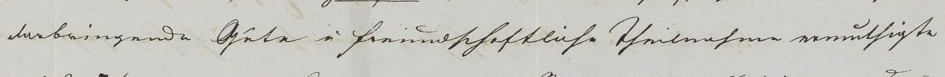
darbringende Güte u freundschaftliche Theilnahme ermuthigte
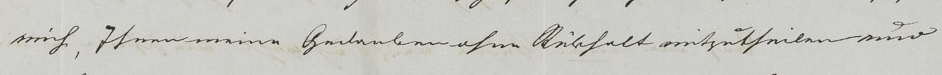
mich, Ihnen meine Gedanken ohne Rükhalt mitzutheilen und
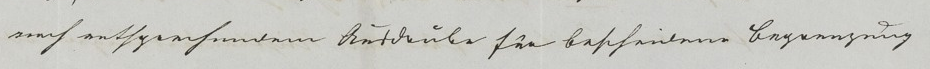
nach entsprechendem Ausdruke für bescheidene Begrenzung
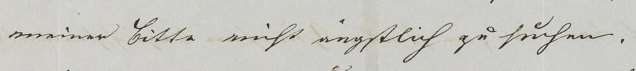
meiner Bitte nicht ängstlich zu suchen.
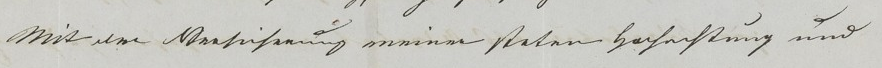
Mit der Versicherung meiner steten Hochachtung und
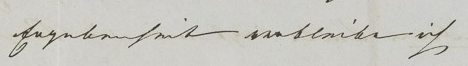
Ergebenheit verbleibe ich
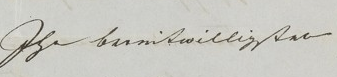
Ihr bereitwilligster
